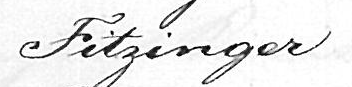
Fitzinger
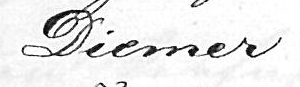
Diemer
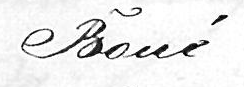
Boué
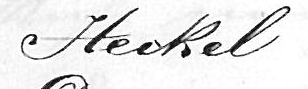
Heckel
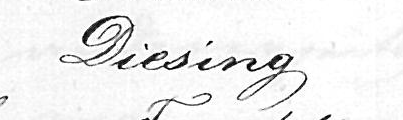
Diesing
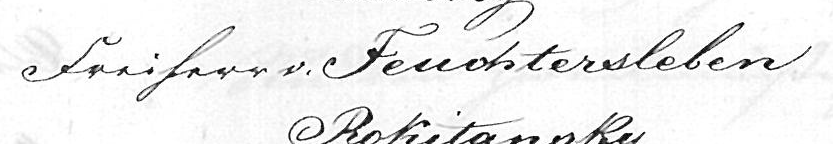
Freiherr v. Feuchtersleben
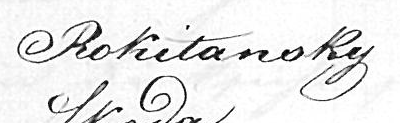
Rokitansky
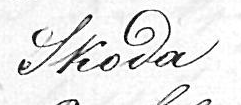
Skoda
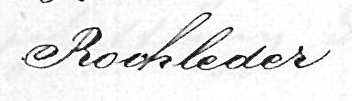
Rochleder
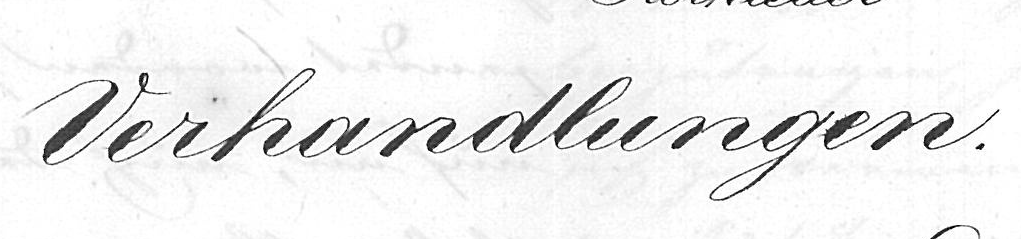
Verhandlungen.
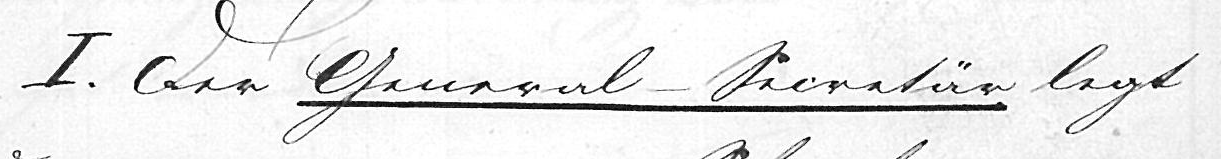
I. Der General-Secretär legt
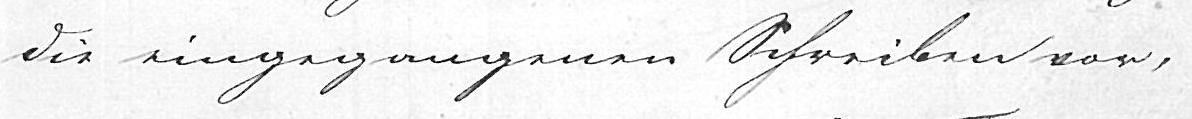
die eingegangenen Schreiben vor,
